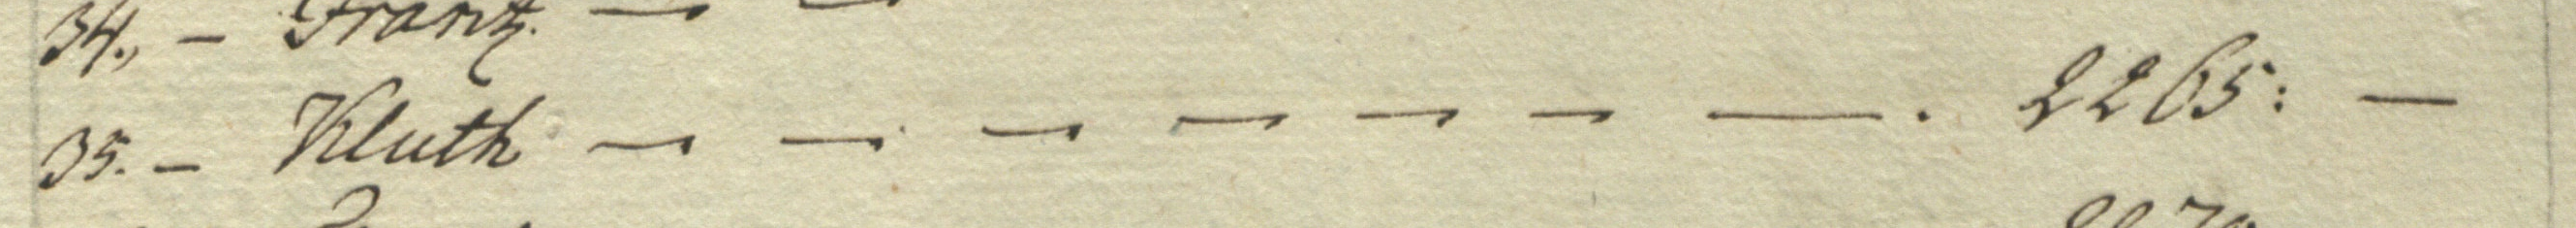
35. Kluth 2265:
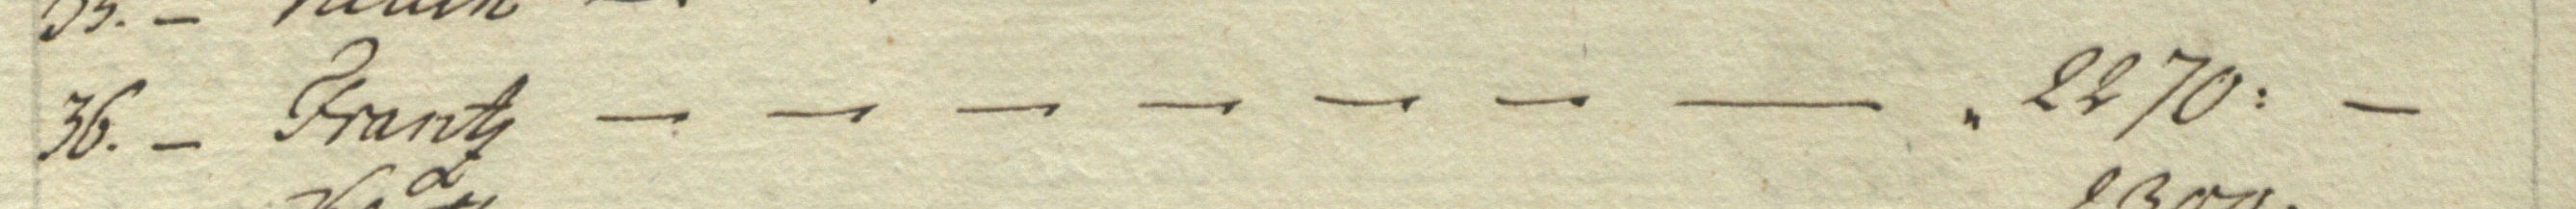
36. Frantz 2270:
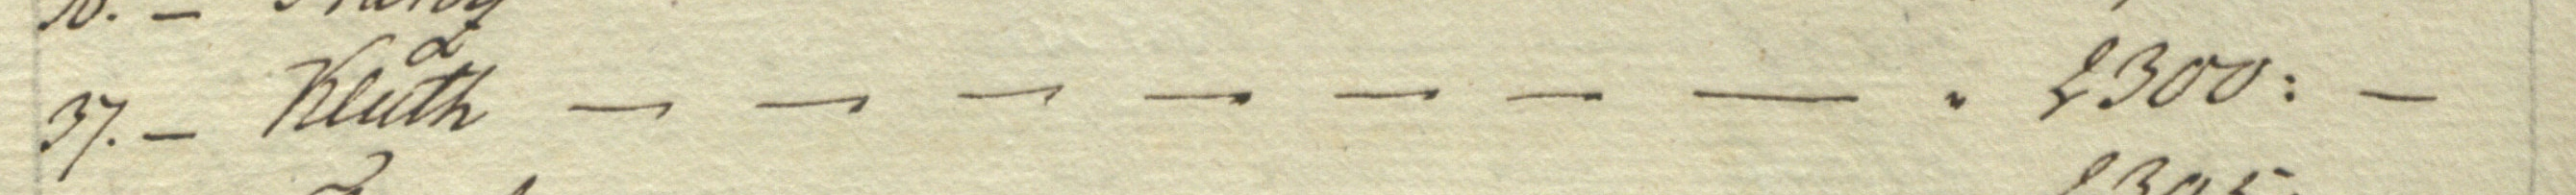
37. Kluth 2300:
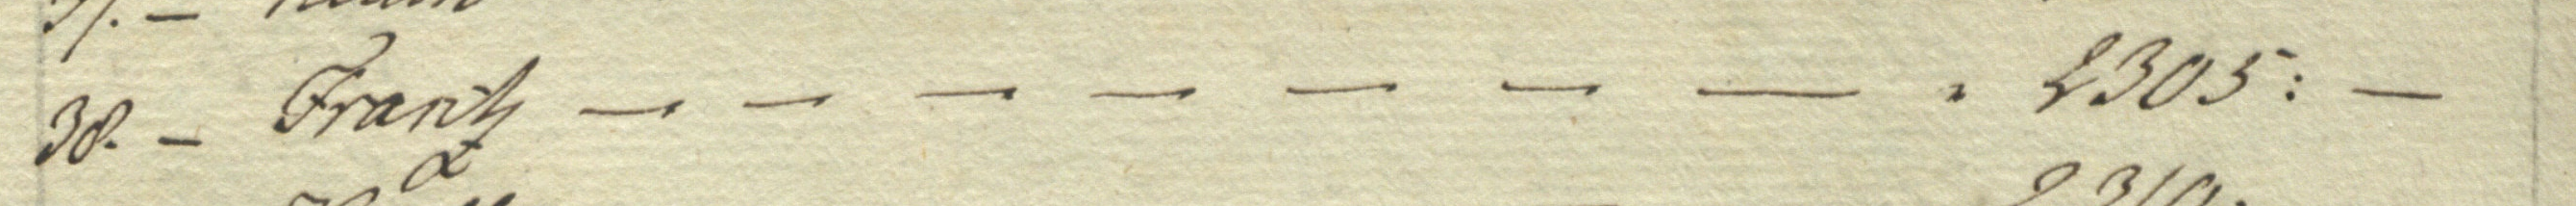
38. Frantz 2305:
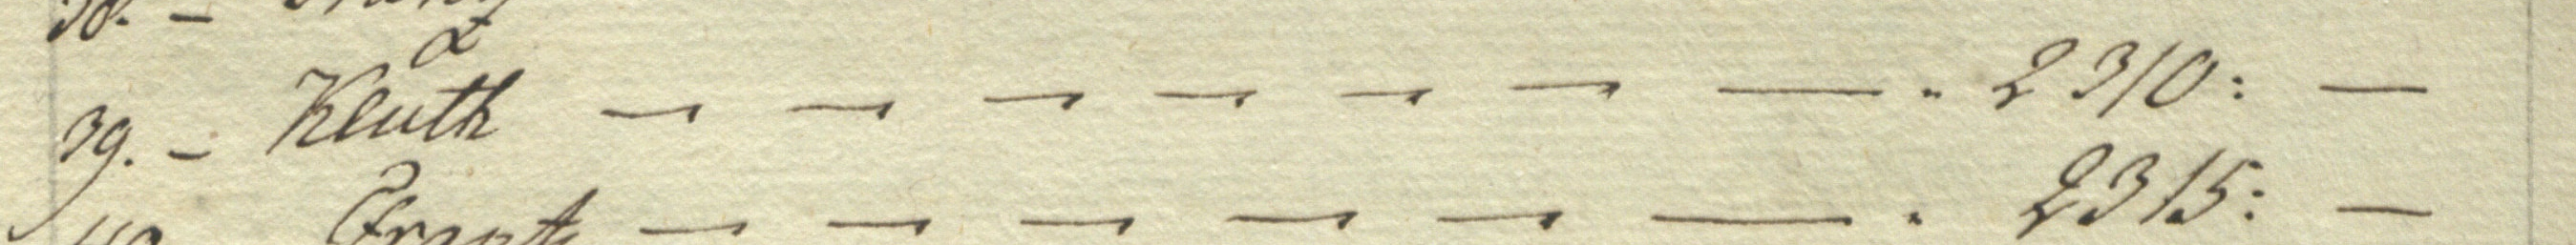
39. Kluth 2310:
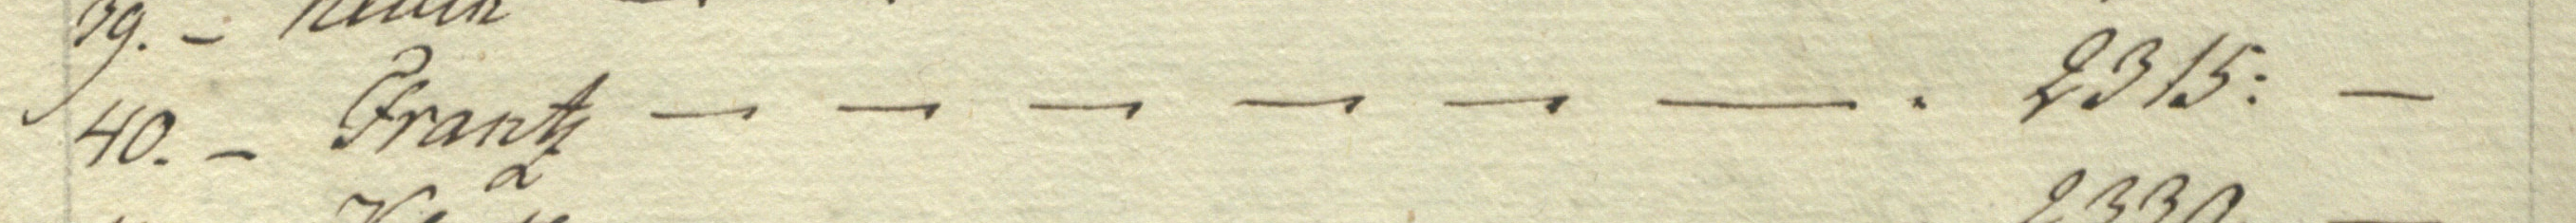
40. Frantz 2315:
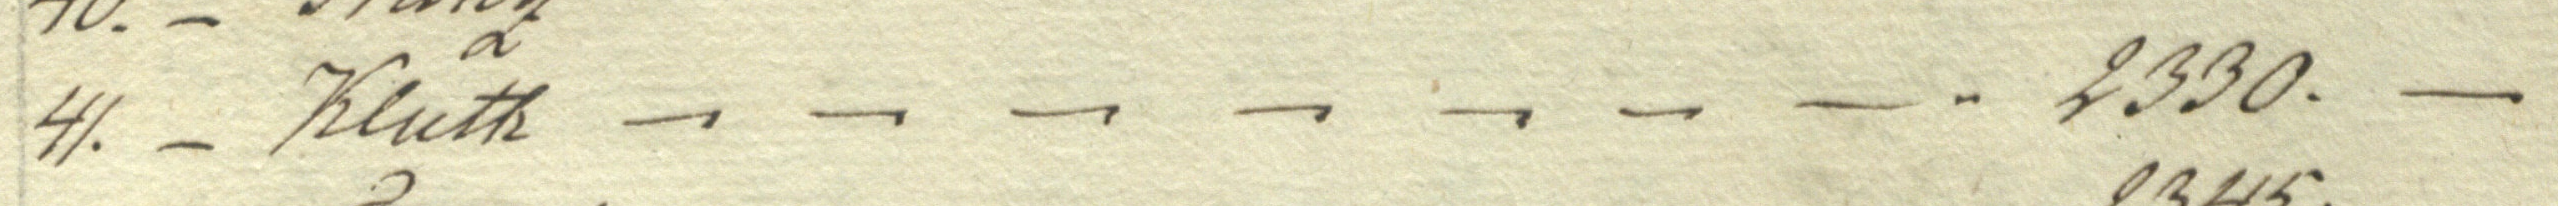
41. Kluth 2330:
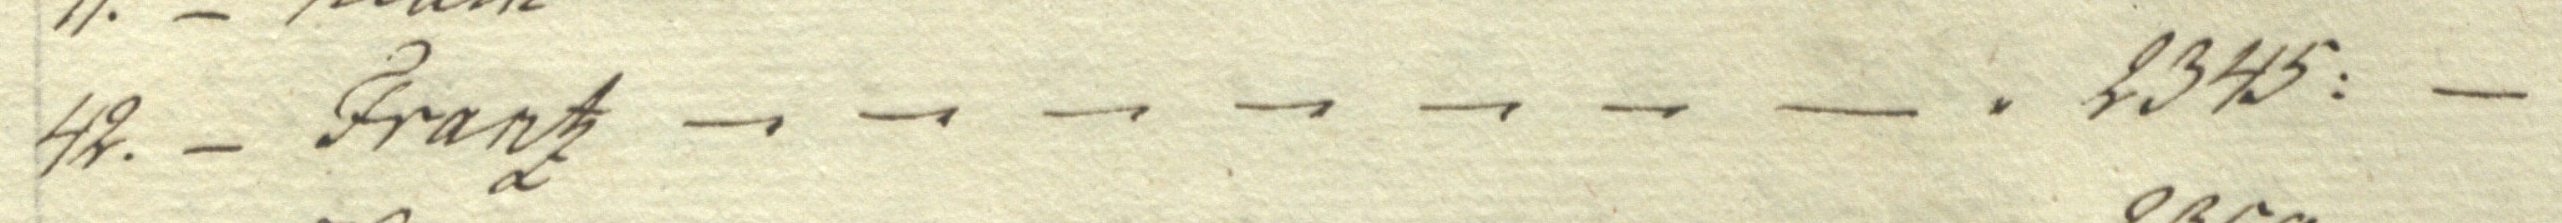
42. Frantz 2345:
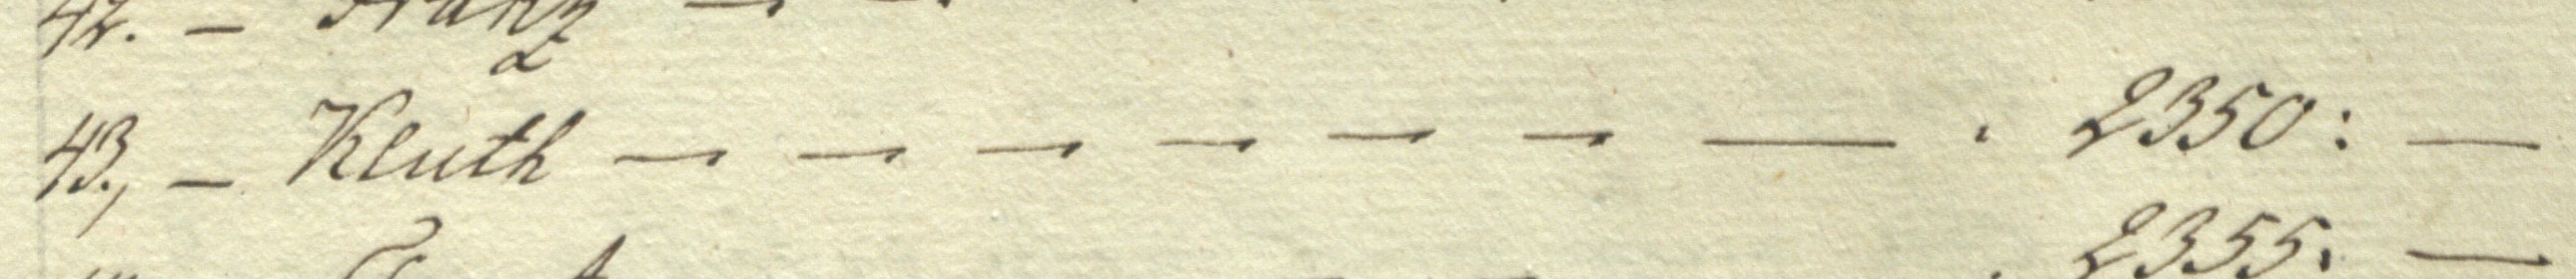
43., Kluth 2350:
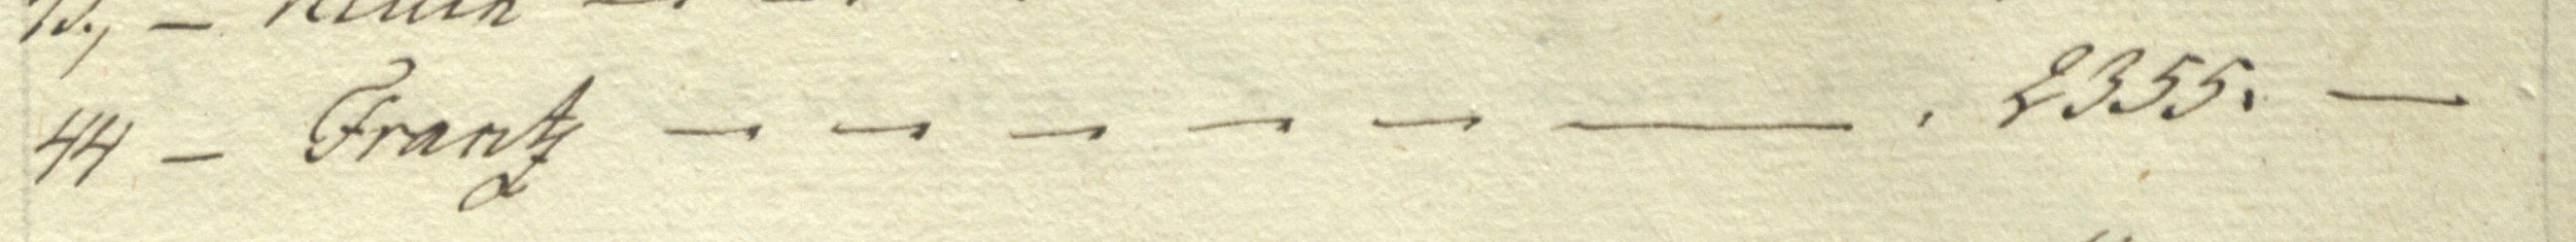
44 Frantz 2355:
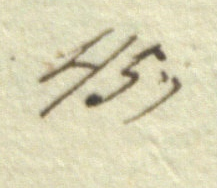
45.,
